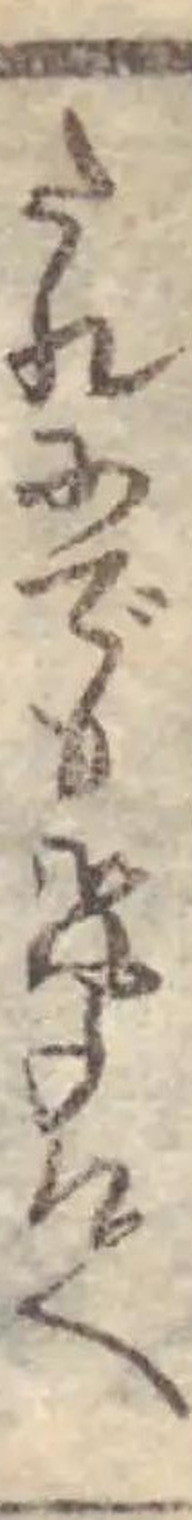たれにでも御聞候へ
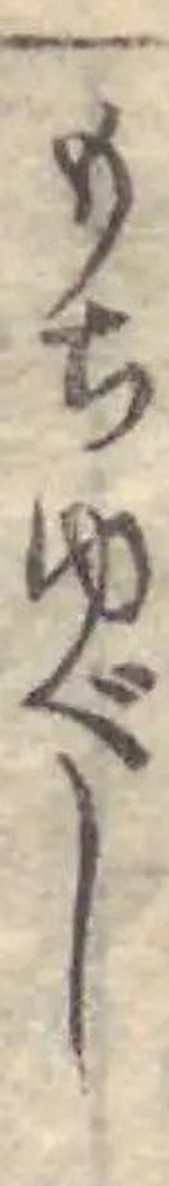もちゆべし
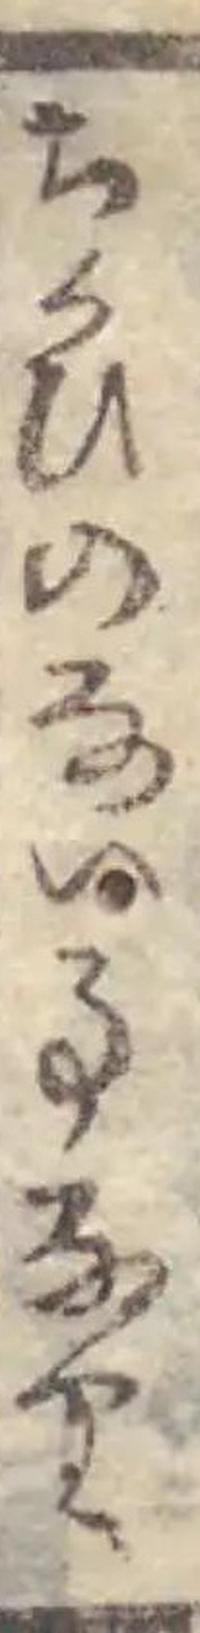ちかひのない事なり
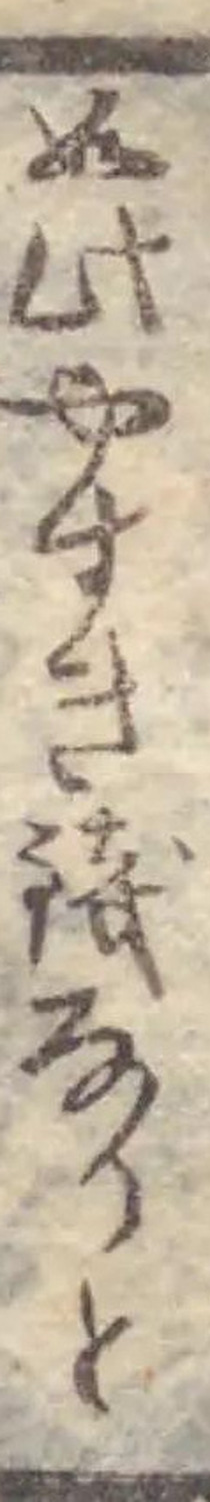如此やすき銭なりと
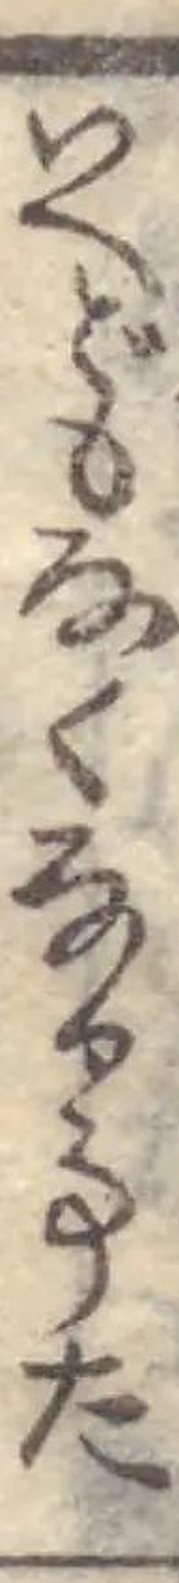いへどもなくなる事た
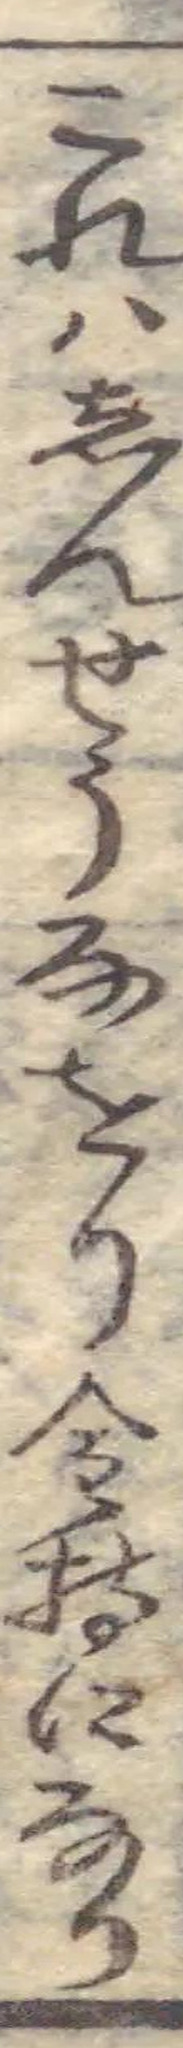これはしんせうなをり金持になり
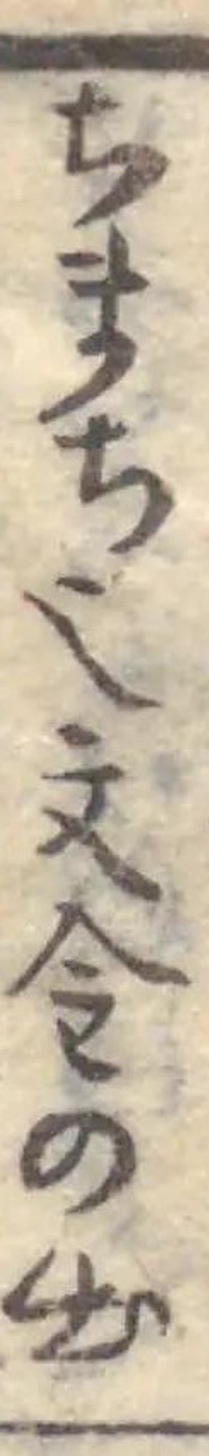ちまち也文金の出
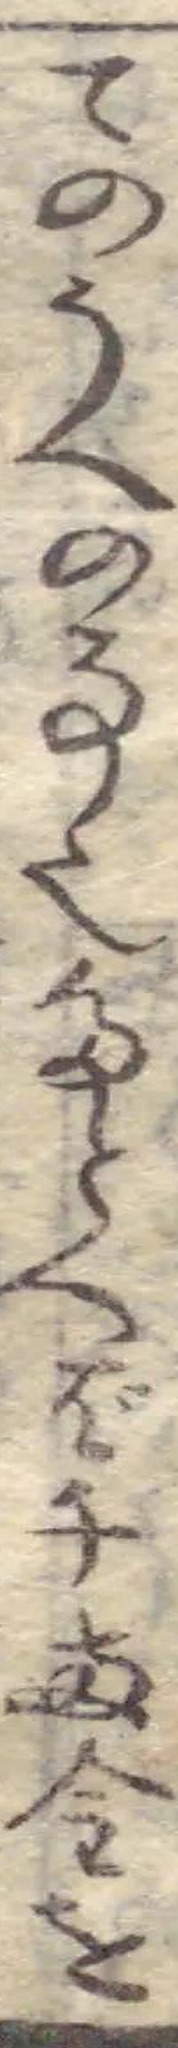てのうへの事也たとへば千両金を
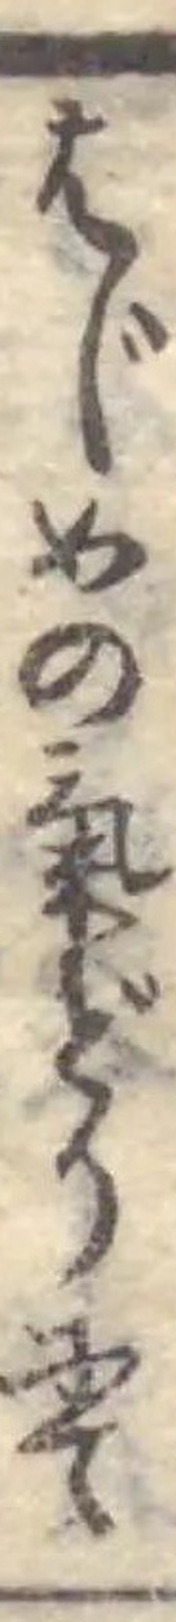はじめの気どりにて
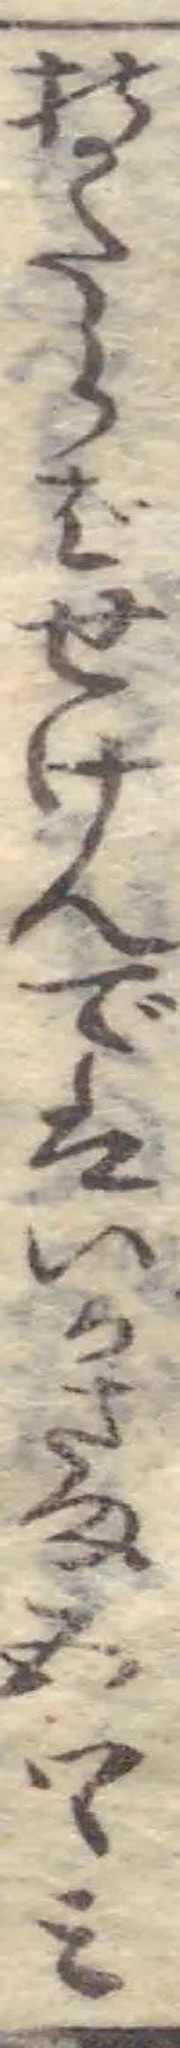持たらばせけんではいかさま五つゝみ
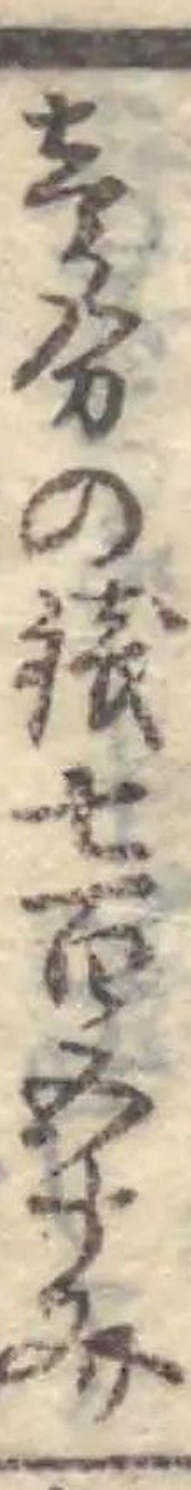壱分の銭七百五十文
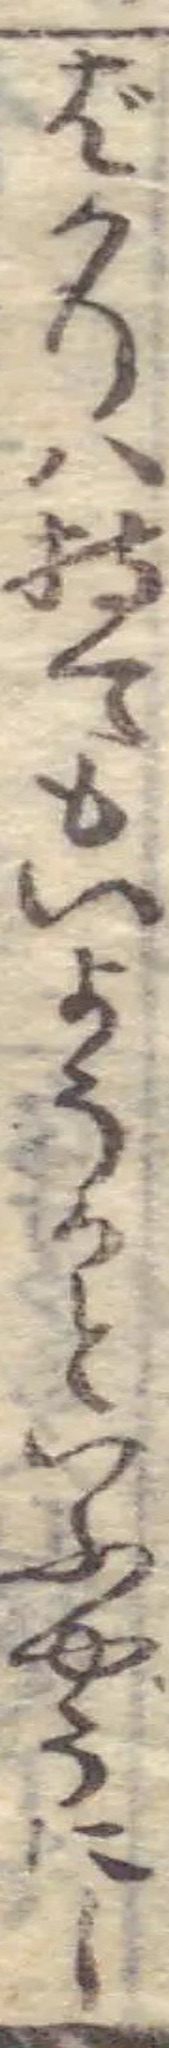ばかりは持てもいようかといふやうにし
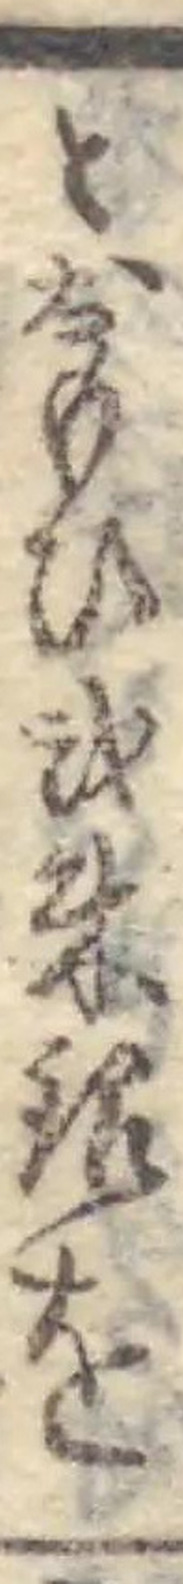とおもひ弐朱銀を
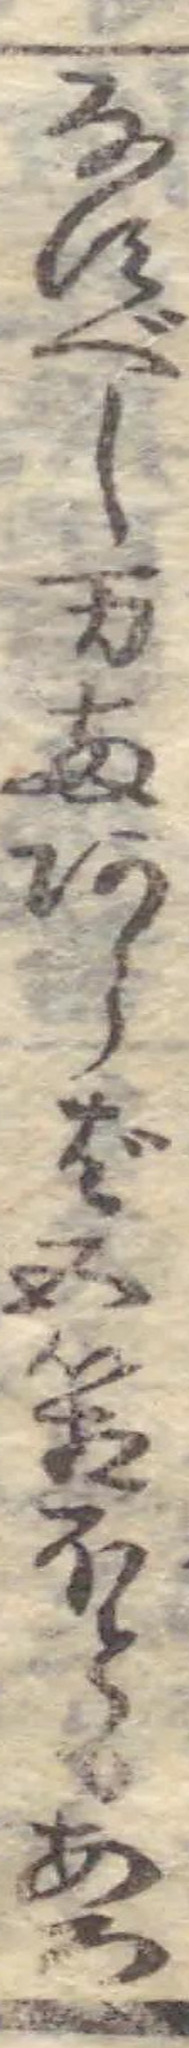なすべし五両あらば五箱ほともあろ
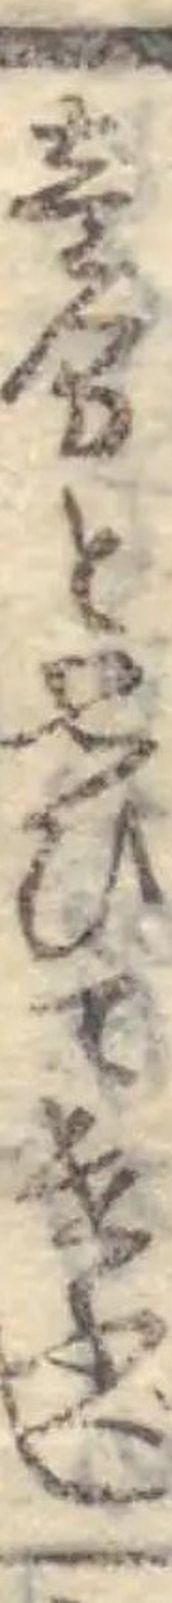壱分と思ひて遣ふべし
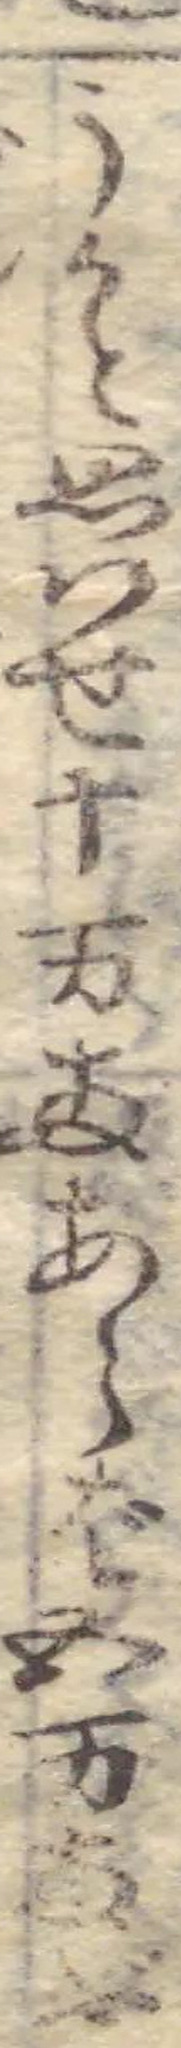うかと思はせ十万両あらば五万両ぶ
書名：大通人好記
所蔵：国立国会図書館 National Diet Library, JAPAN
